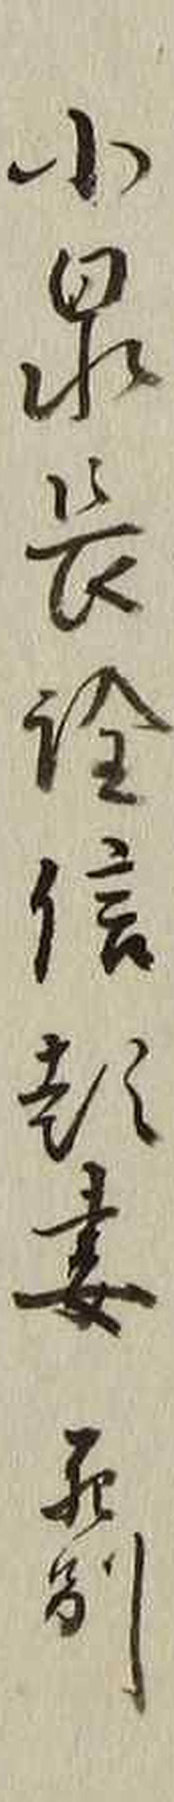小泉長詮信起妻死別
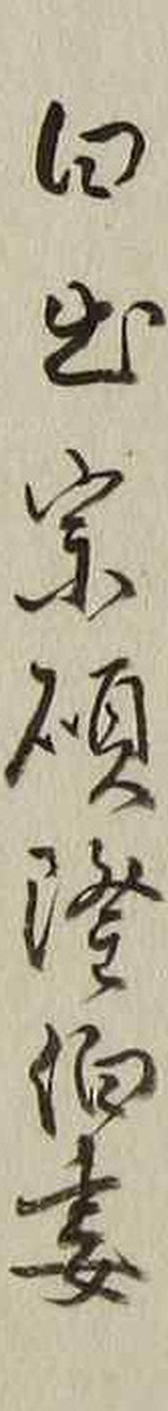日？出宗碩隆伯妻
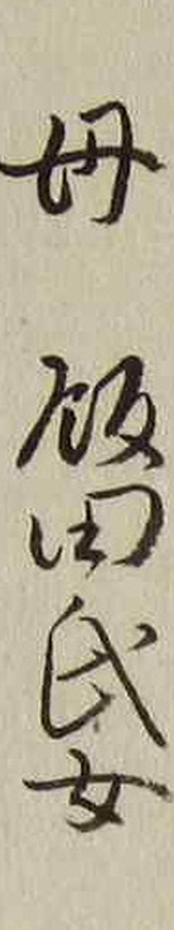母飯田氏女
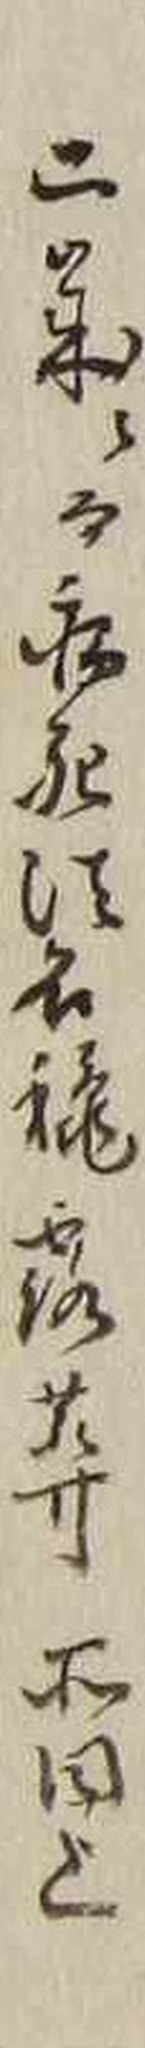二歳ニ而病死法名秋露葬所同上

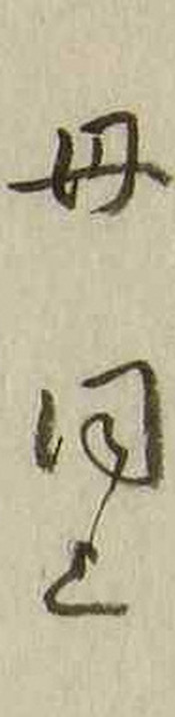母同上
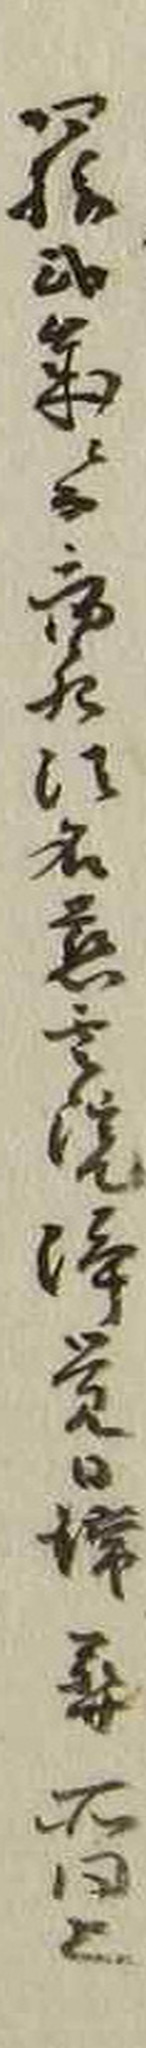四拾弐歳ニ而病死法名慈玄院浄覚日葬所同上
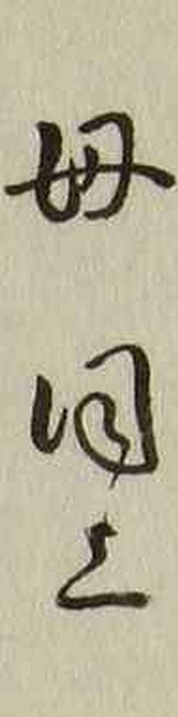母同上
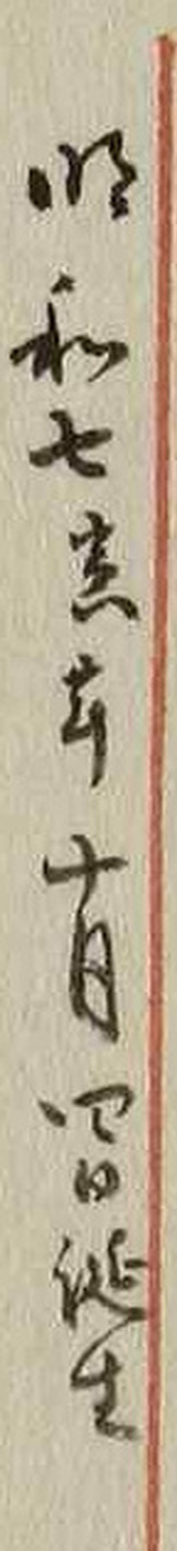明和七寅年十月四日誕生
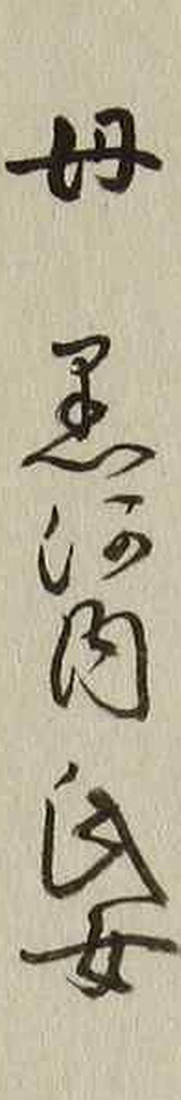母黒河内氏女
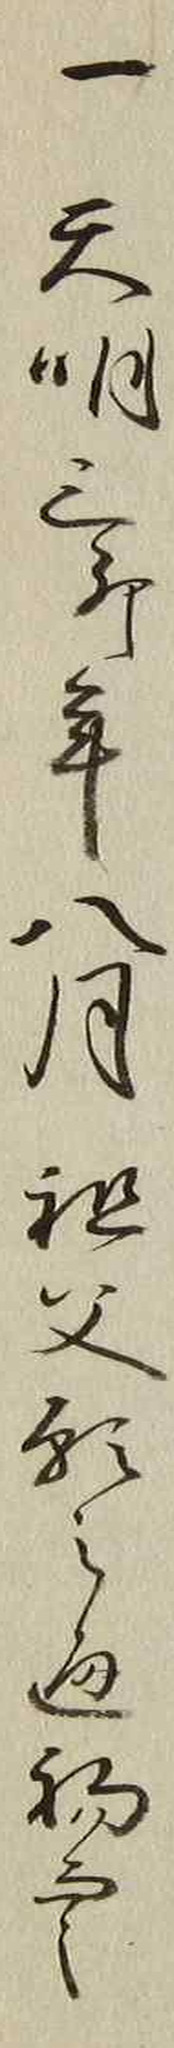一天明三卯年八月祖父願之通初而之
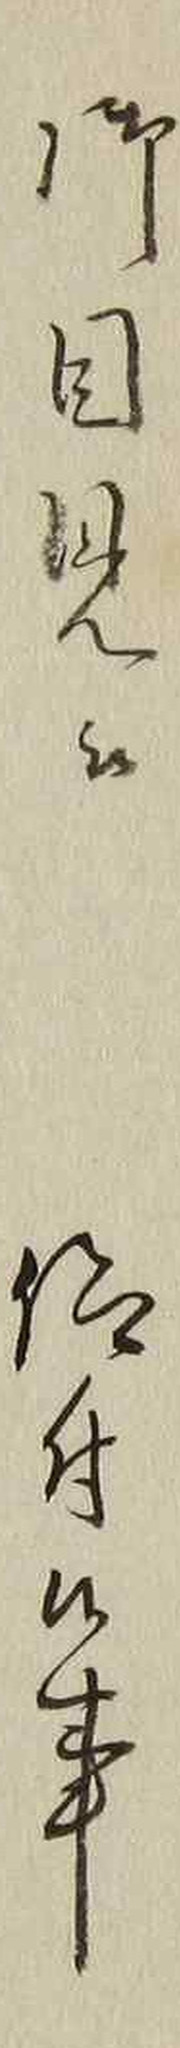御目見被仰付候事
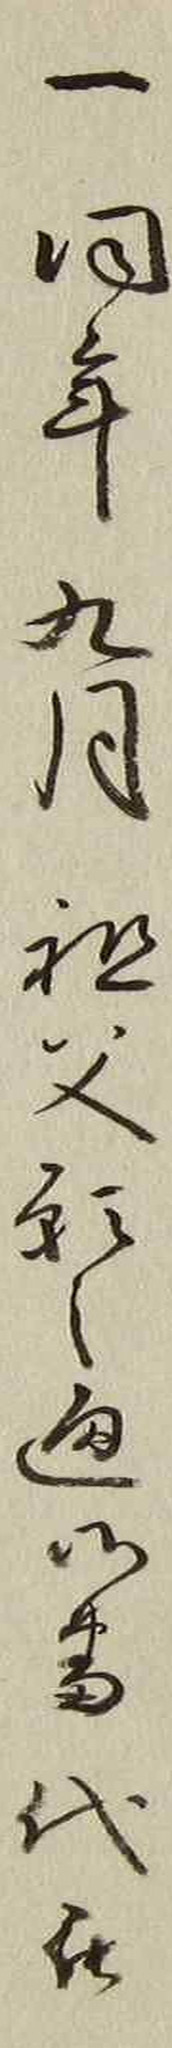一同年九月祖父願之通御番代被
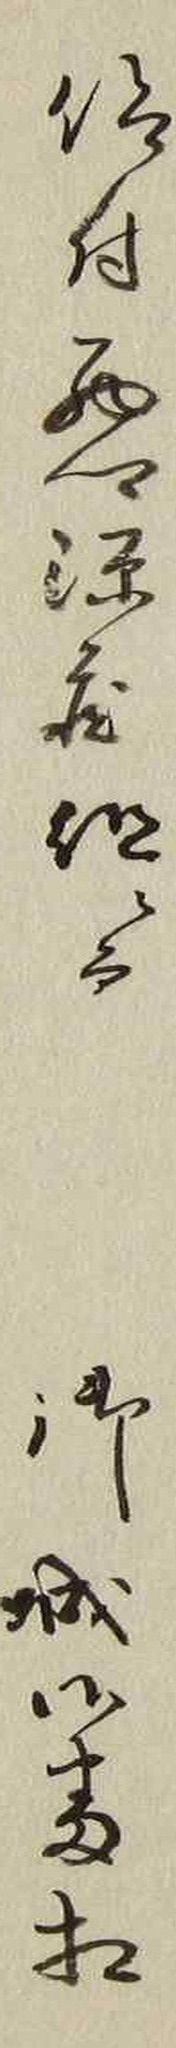仰付西郷源蔵組ニ而御城御番相
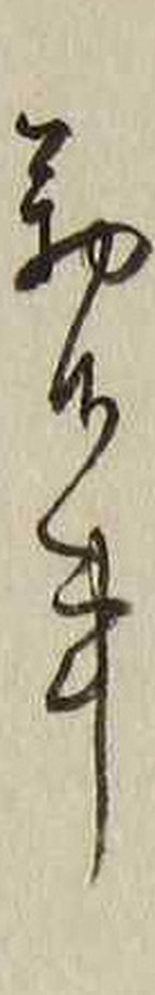勤候事
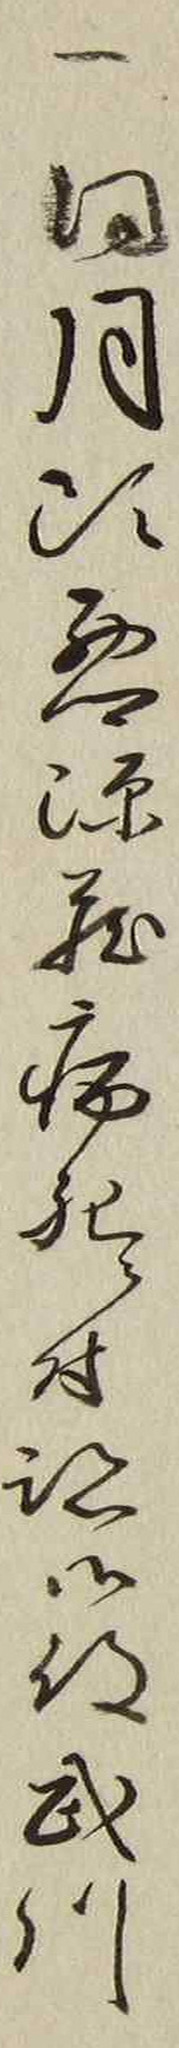一同月頭西郷源蔵病死ニ付跡御役武川
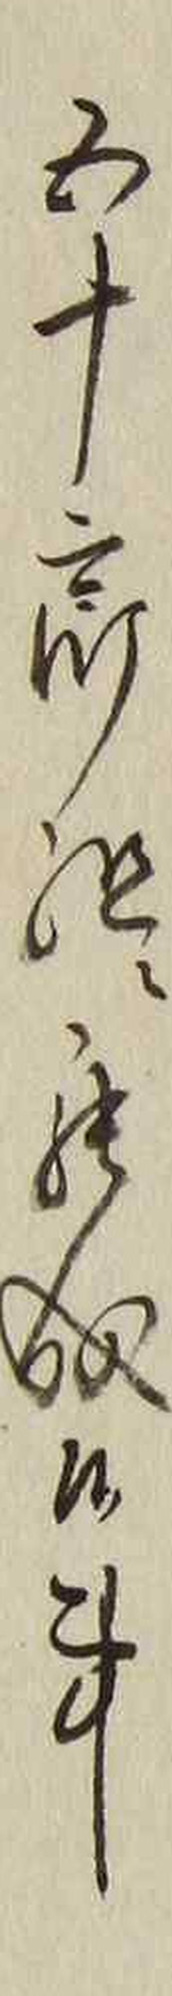五十郎組ニ罷成候事
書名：諸士系譜　巻之4　い之部4
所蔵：会津若松市立会津図書館
